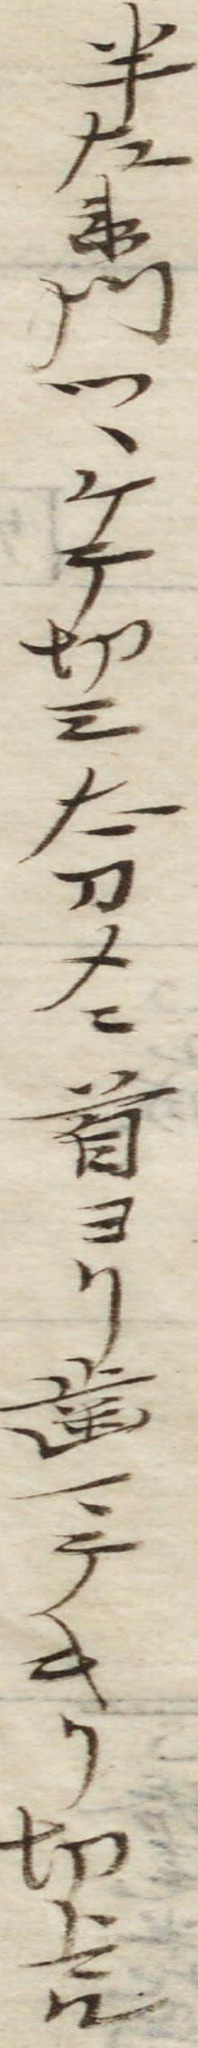半左衛門ツ丶ケテ切三太刀メ首ヨリ歯マテキリ切トマル
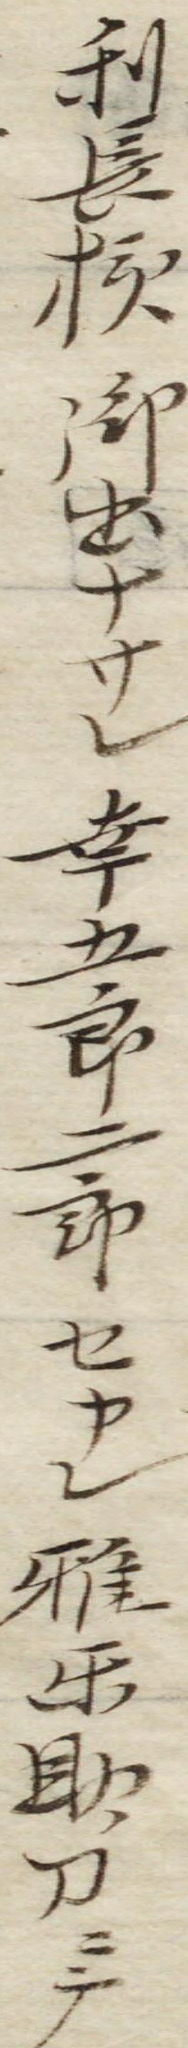利長様御出ナサレ幸五郎二郎セカレ雅楽助刀
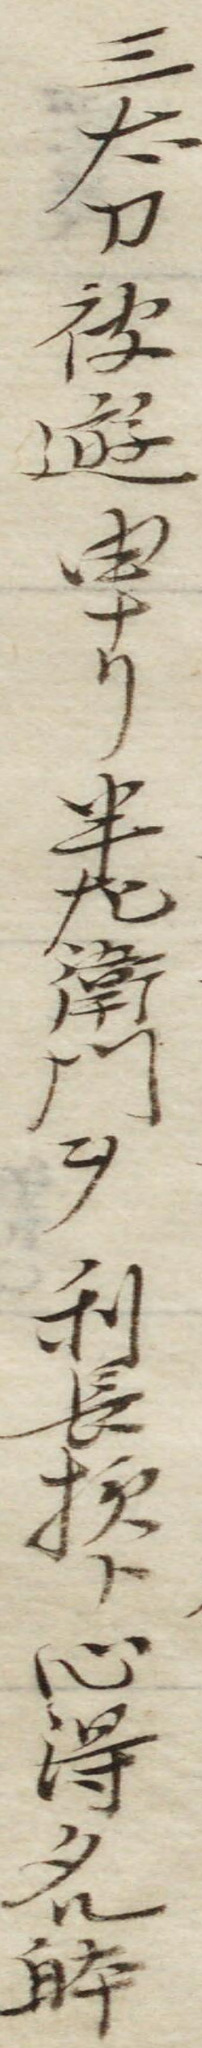三太刀被遊由ナリ半左衛門ヲ利長様ト心得タル

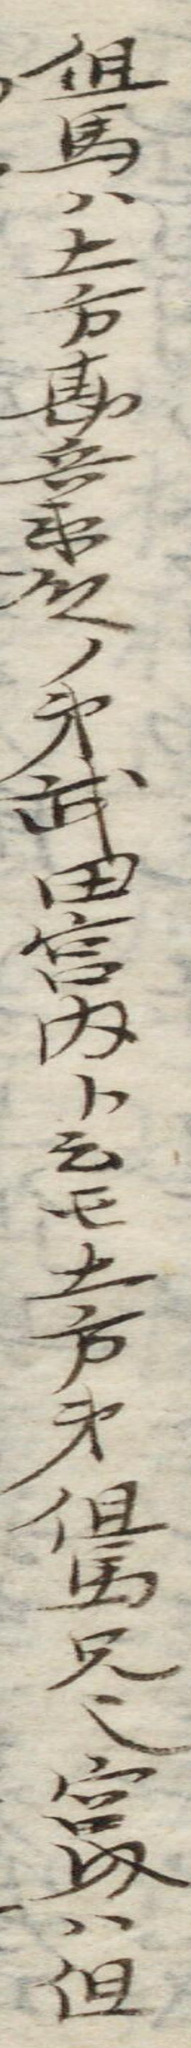但馬ハ土方勘兵衛殿ノ弟竹田官内ト云モ土方弟但馬兄也宮内ハ但
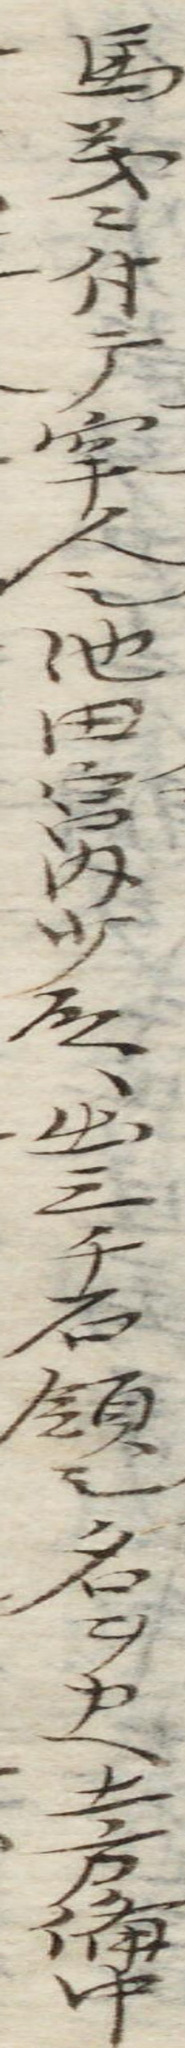馬弟ニ付テ牢人シ池田宮内少殿へ出三千石領シ名ヲカへ土方備中
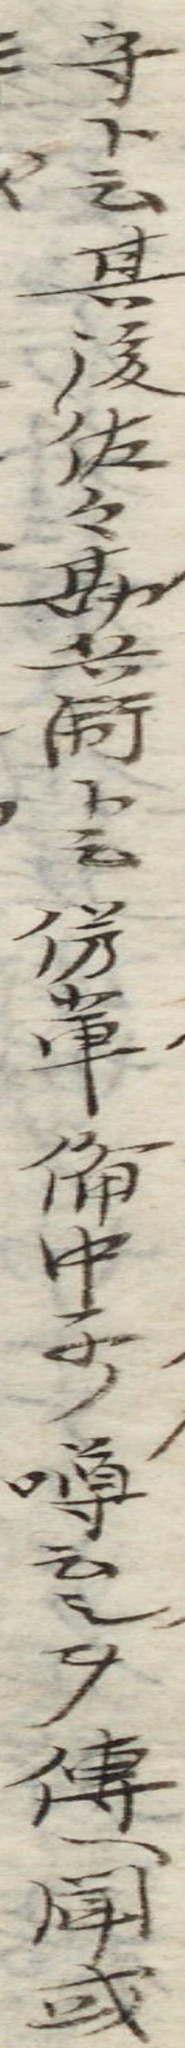守ト云其後佐々官兵衛ト云傍輩備中子ノ噂云シヲ伝へ聞或
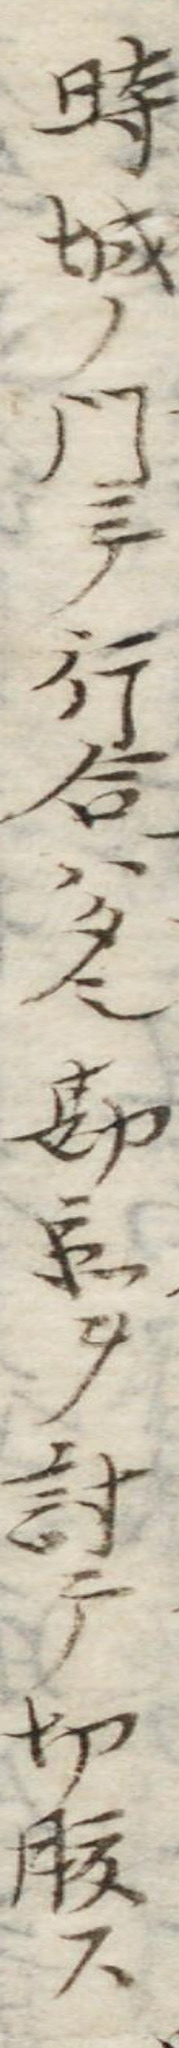時城ノ門行合ハタシ勘衛ヲ討テ切腹ス
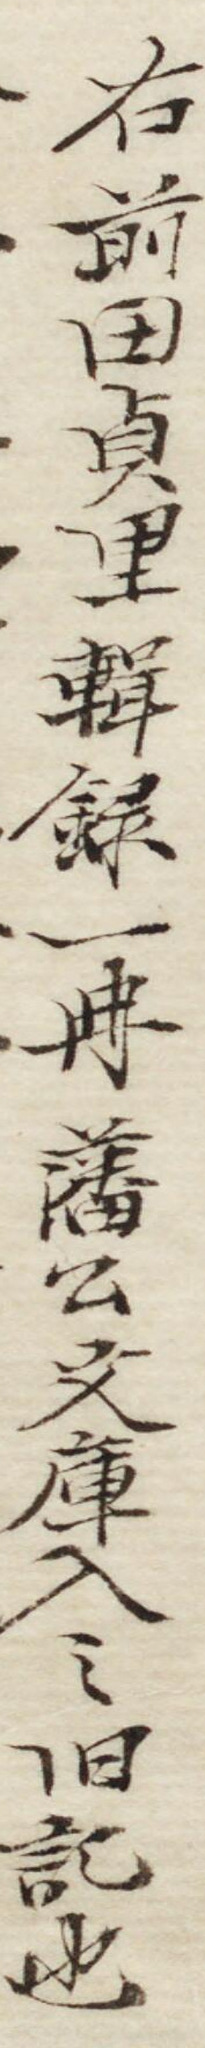右前田貞里輯録一冊藩公文庫入之旧記也
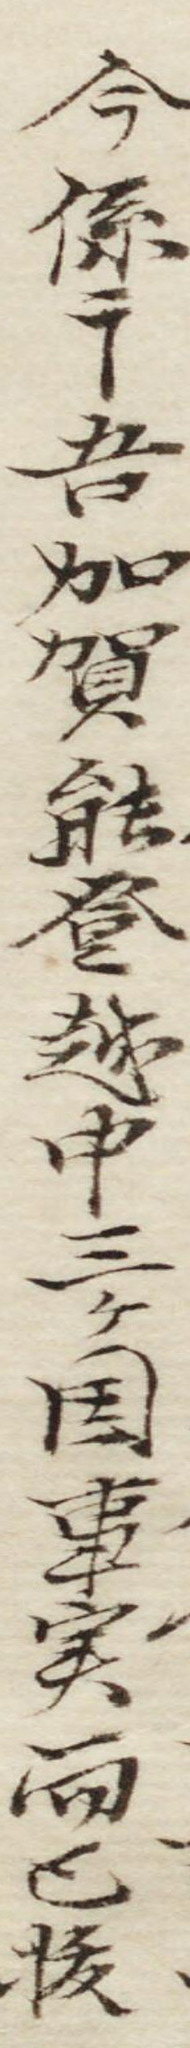今係亍吾加賀能登越中三ヶ国事実而已抜
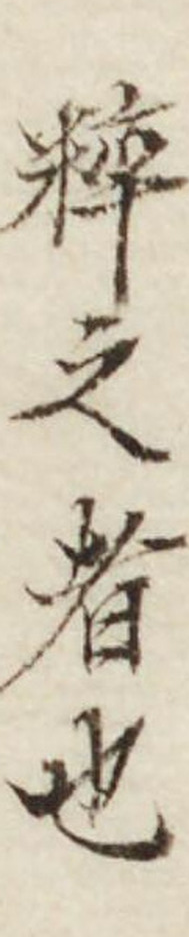粋之者也
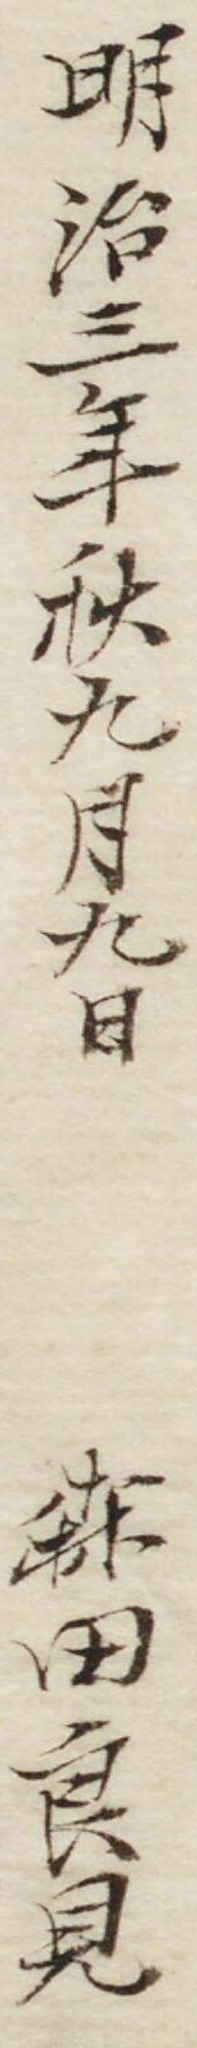明治三年秋九月九日森田良見
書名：聞見雑録
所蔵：Ishikawa Prefectural Library
